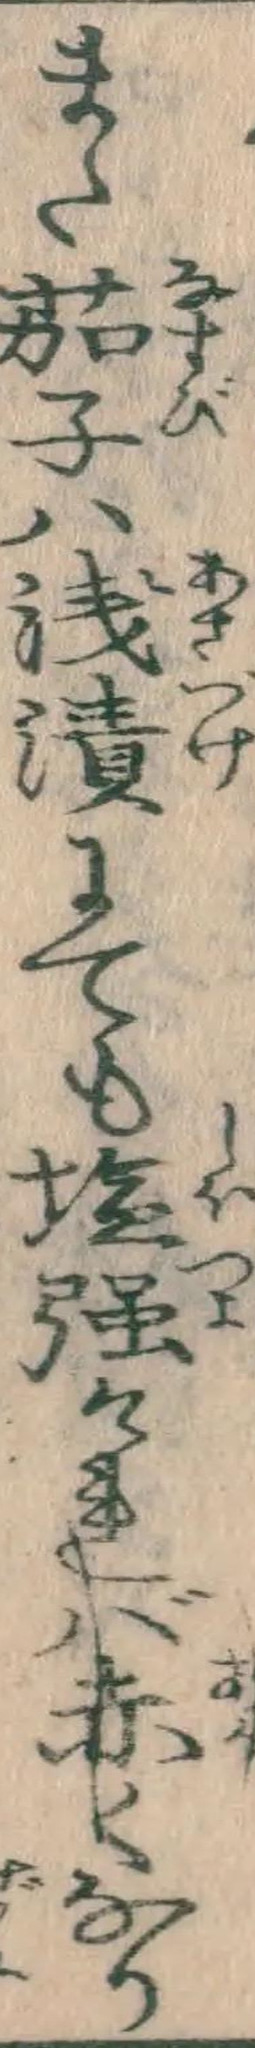また茄子は浅漬にても塩強ければ赤くなり
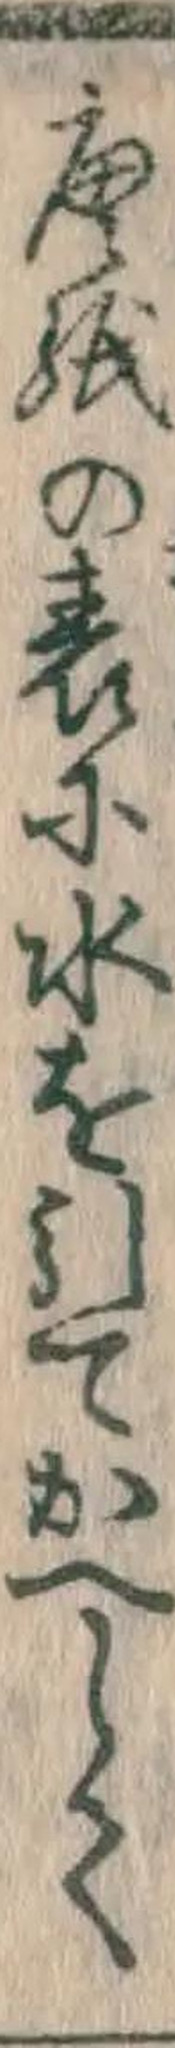唐紙の表に水を引てかへして
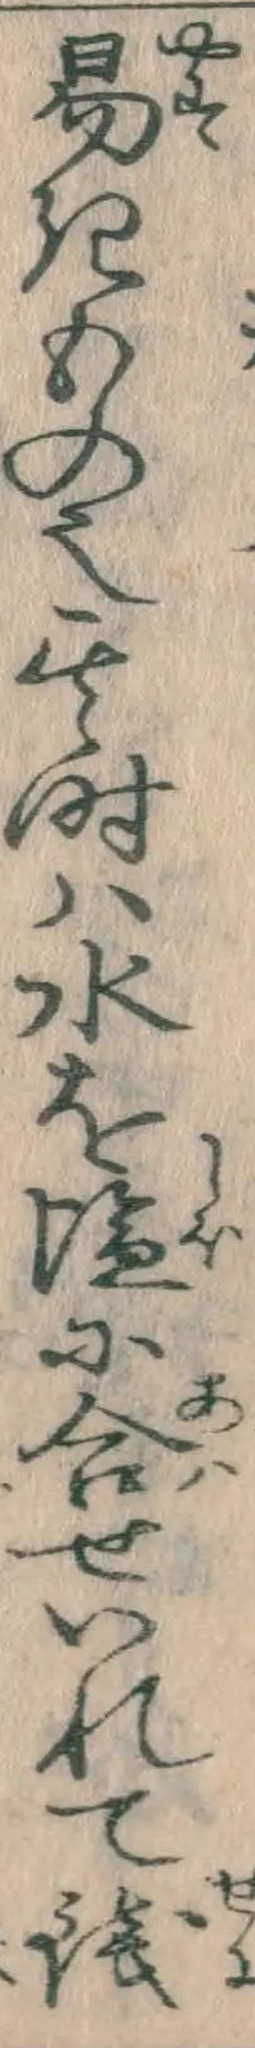易きもの也其時は水を塩に合せいれて銭
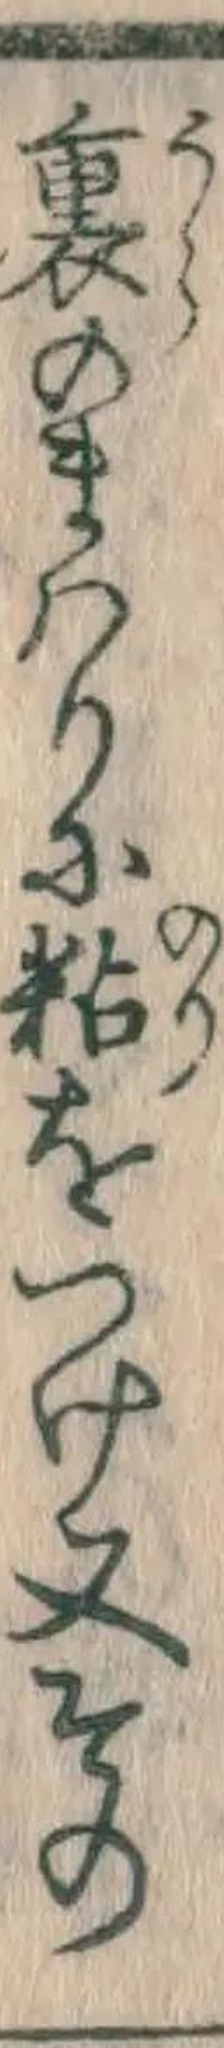裏のまわりに粘をつけ又その
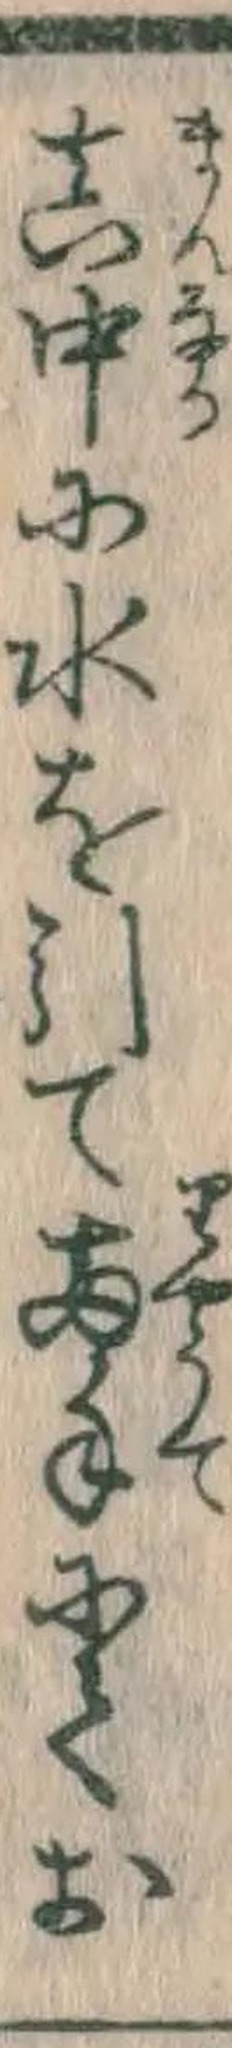真中に水を引て両手にてお
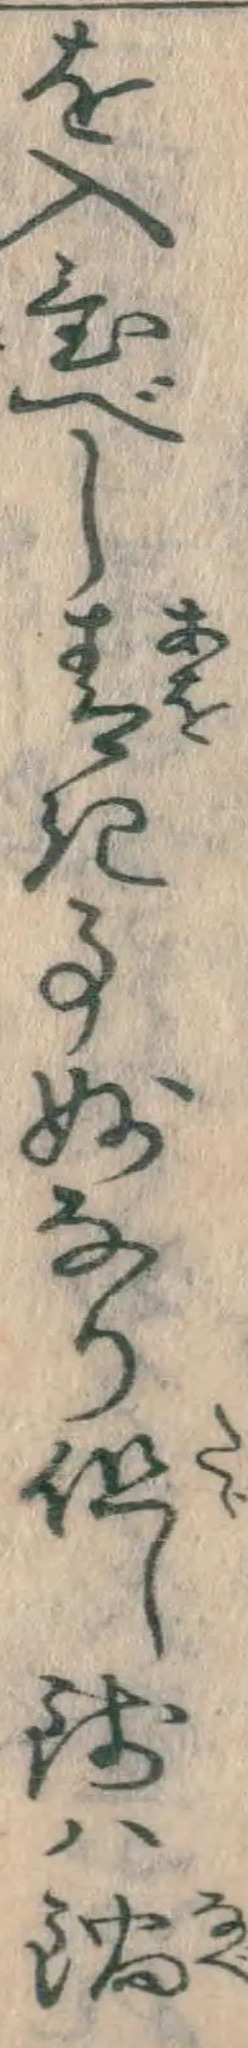を入置べし青き事妙なり但し銭は鍋
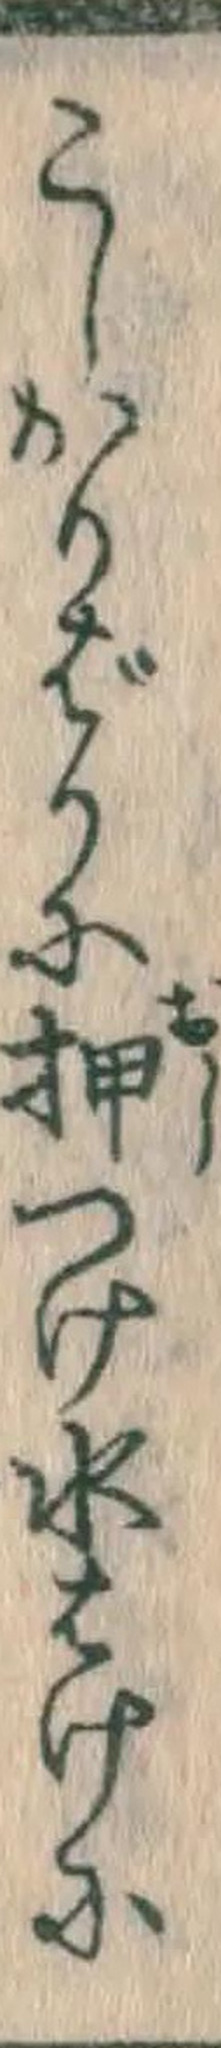こしかりばりに押つけ水はけに
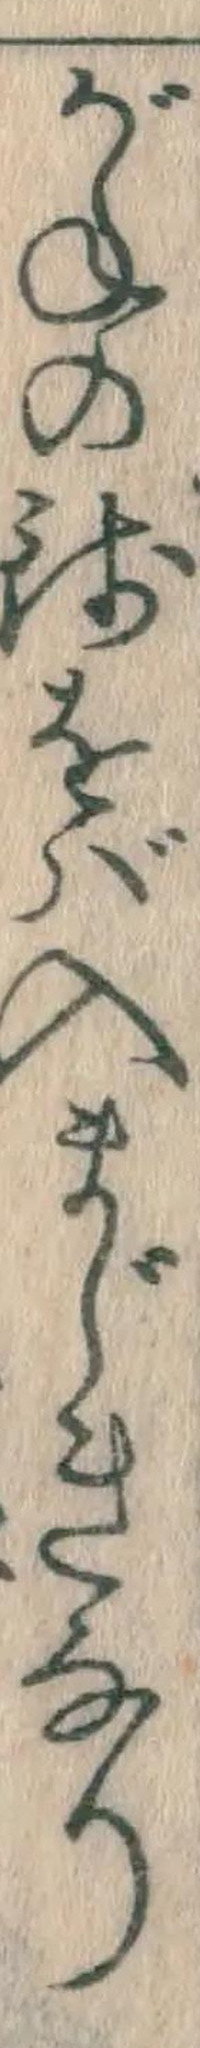がねの銭をば入まじきなり
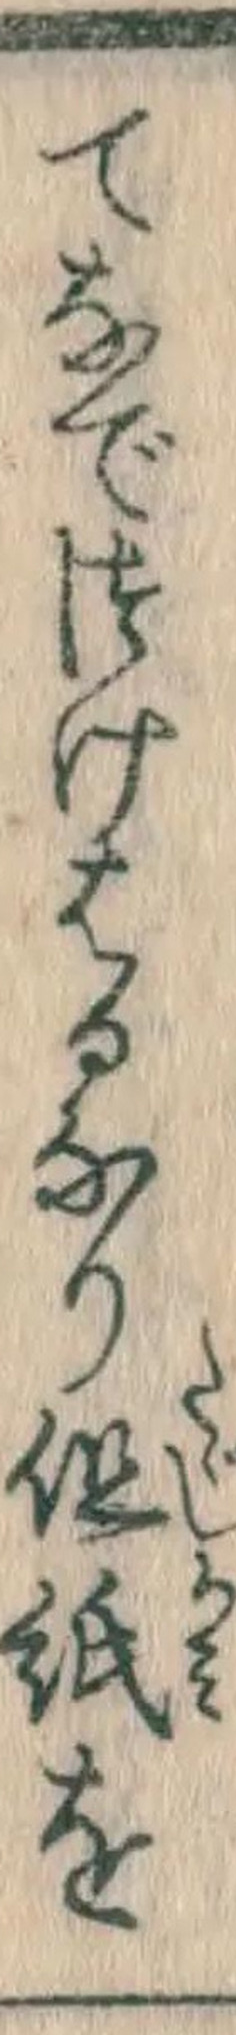てなでつけはるなり但紙を
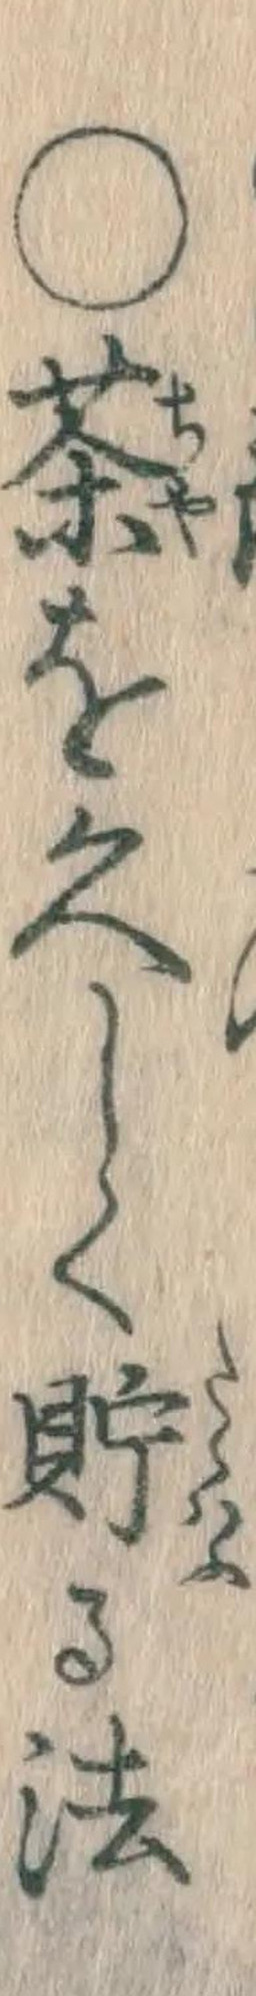○茶を久しく貯る法
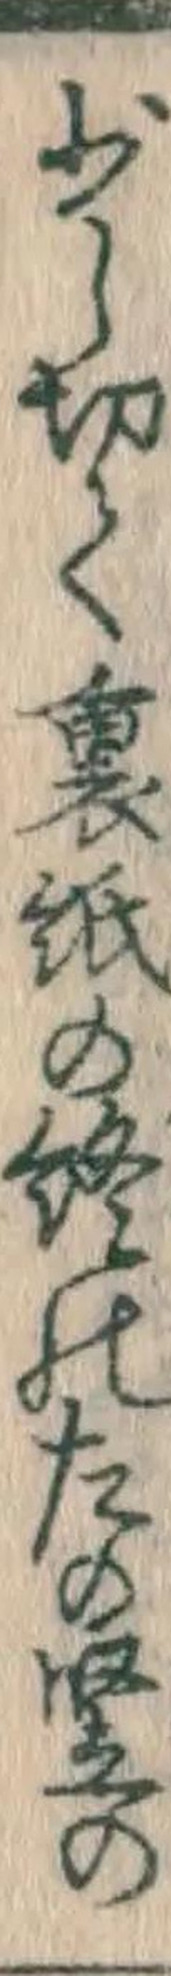少し切て裏紙の終のたの竪の
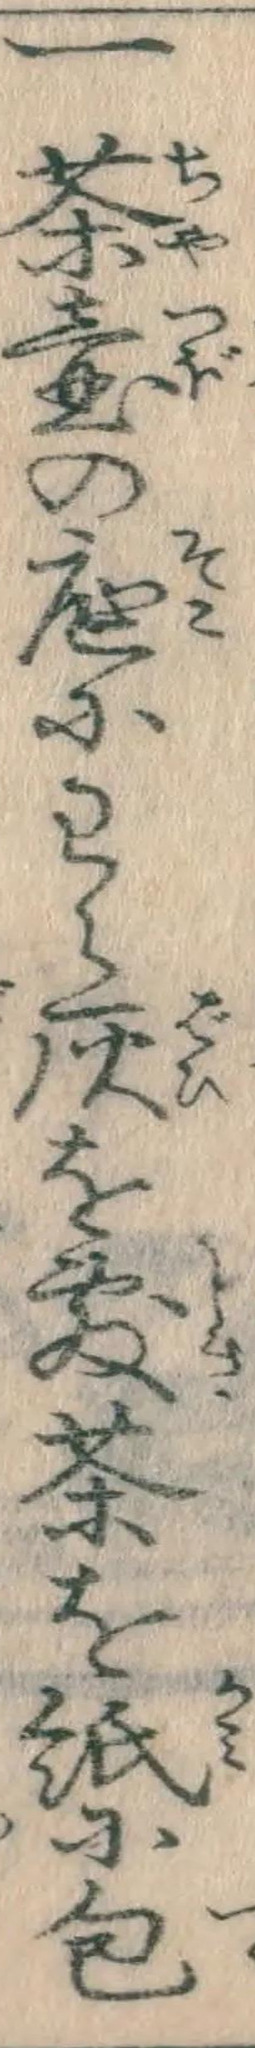一茶壺の底にわら灰を敷茶を紙に包
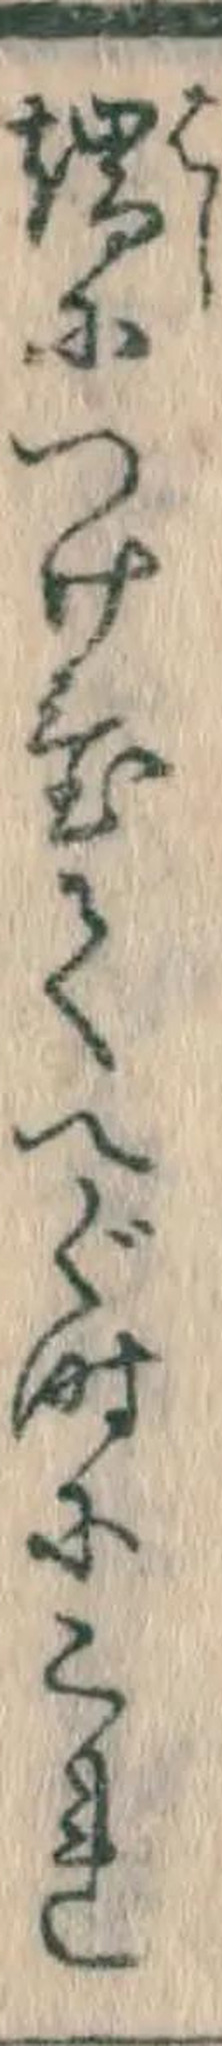端につけ置てへぐ時にこれ
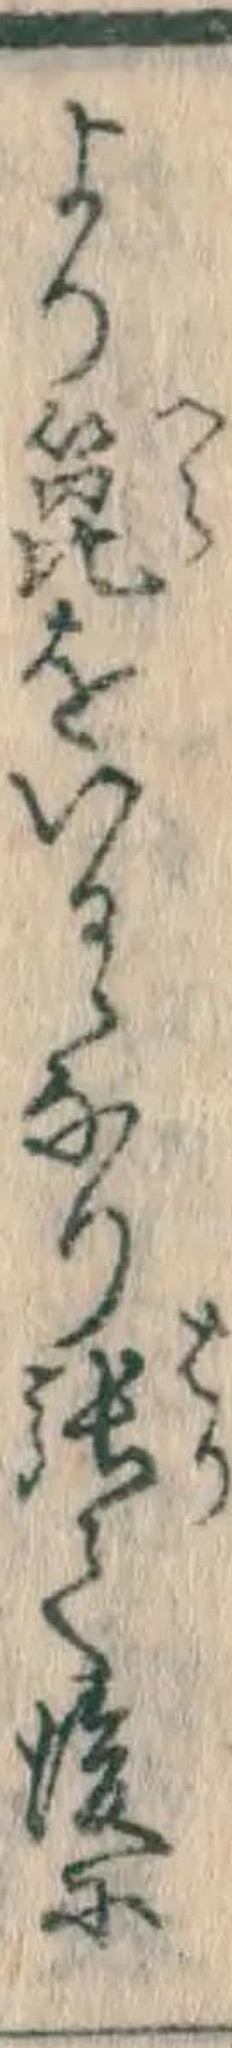より箆をいるゝなり張て後に
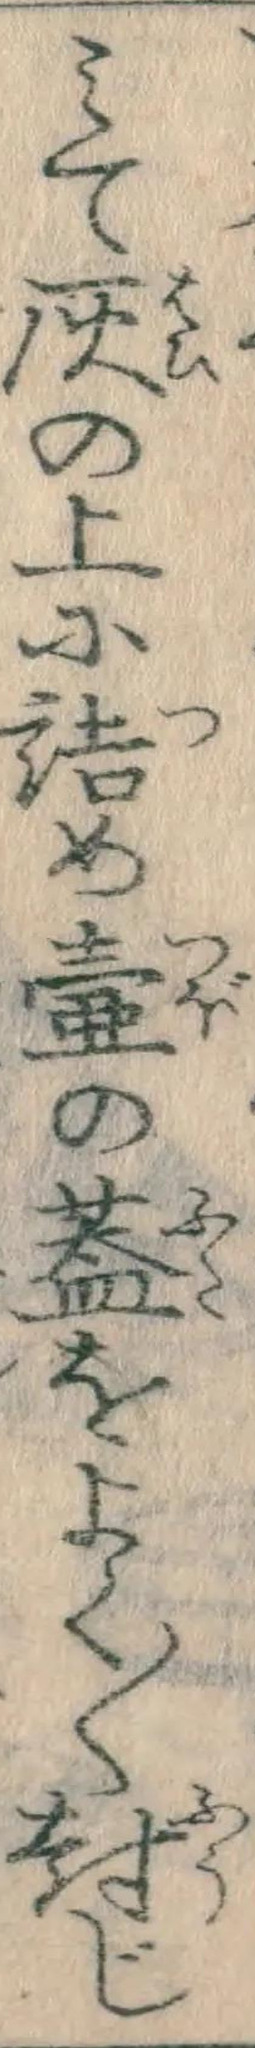みて灰の上に詰め壺の葢をよく〳〵封じ
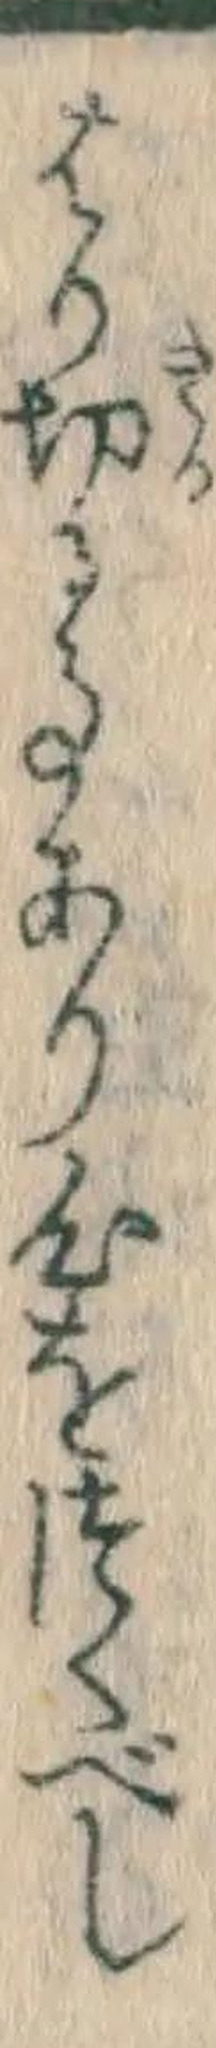はり切る事あり心をつくべし
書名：広益秘事大全 3巻. [2]
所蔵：国立国会図書館 National Diet Library, JAPAN
